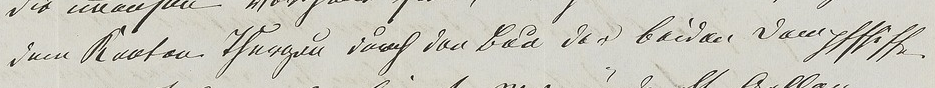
dem Kanton Thurgau durch den Bau der beiden Dampfschiffe
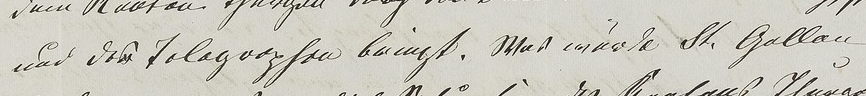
und des Telegraphen bringt. Was würde St. Gallen
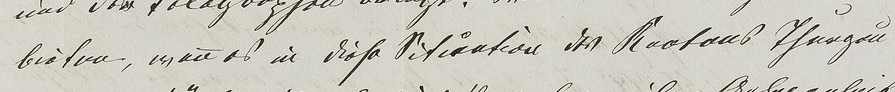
bieten, wenn es in diese Situation des Kantons Thurgau
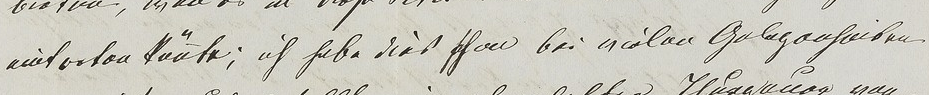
eintreten könnte; ich habe dies schon bei vielen Gelegenheiten
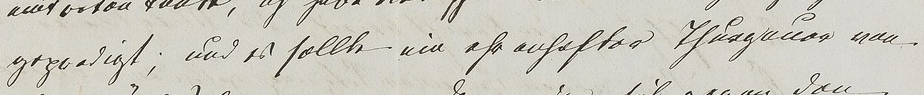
gepredigt; und es sollte ein ehrenhafter Thurgauer von
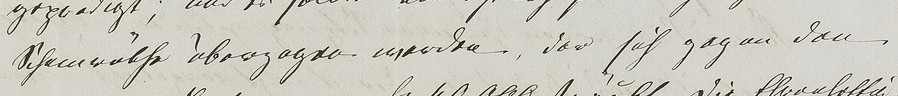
Schamröthe überzogen werden, der sich gegen den
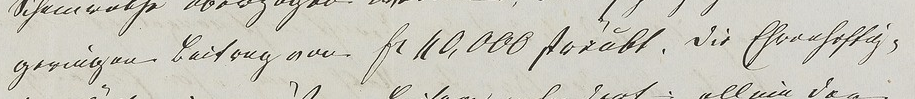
geringen Beitrag von fr 40,000 sträubt. Die Ehrenhaftig-
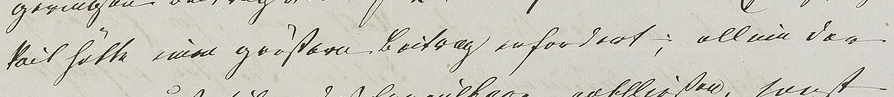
keit hätte einen größern Beitrag erfordert; allein der
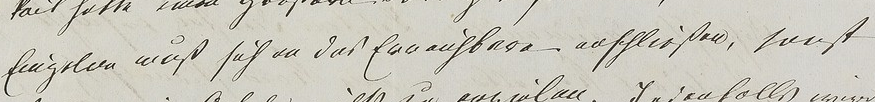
Einzelne muß sich an das Erreichbare anschließen, sonst
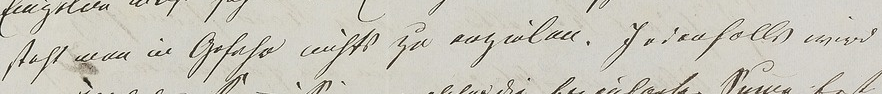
steht man in Gefahr nichts zu erzielen. Jedenfalls wird
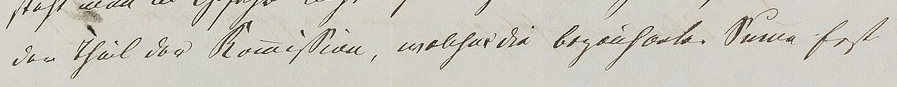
der Theil der Kommission, welcher die bezeichnete Summe fest
